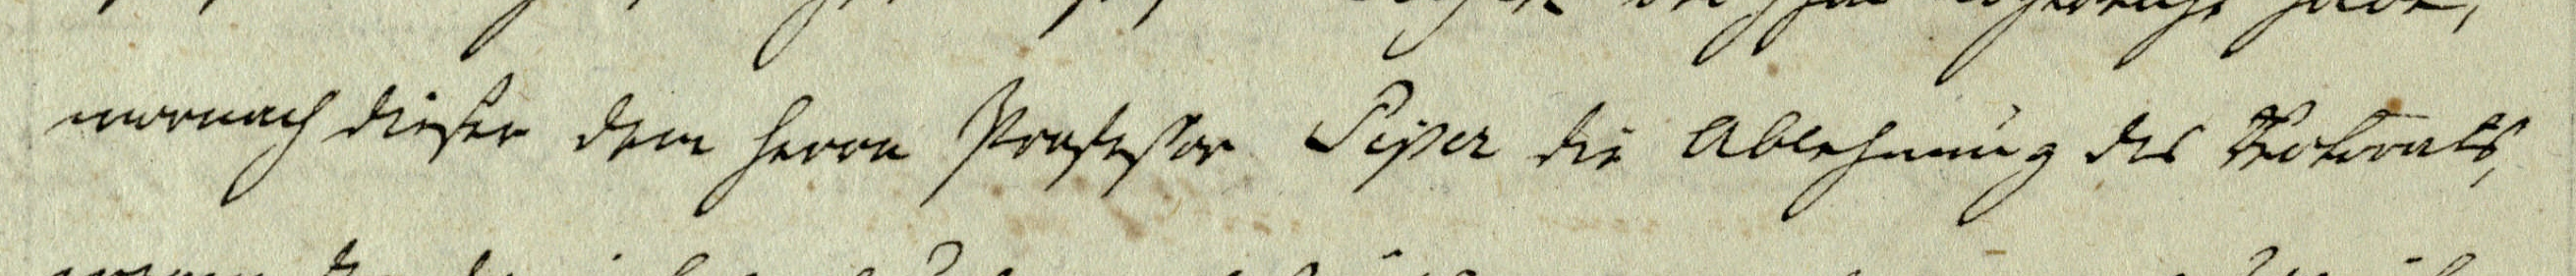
wornach dieser dem Herrn Professor Piper die Ablehnung des Rectorats,
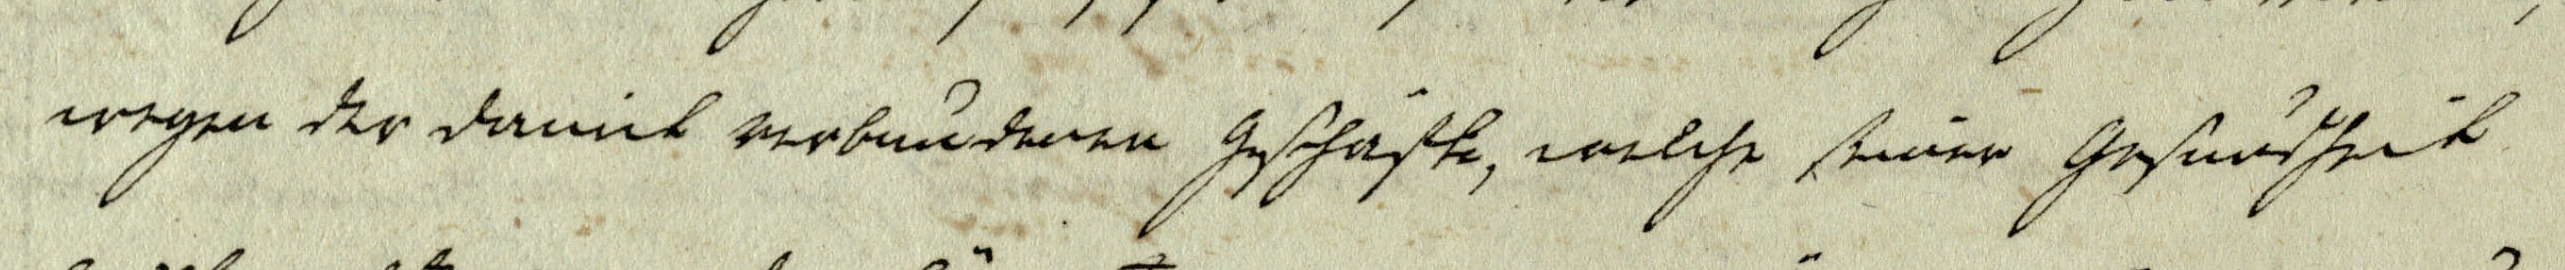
wegen der damit verbundenen Geschäfte, welche seiner Gesundheit
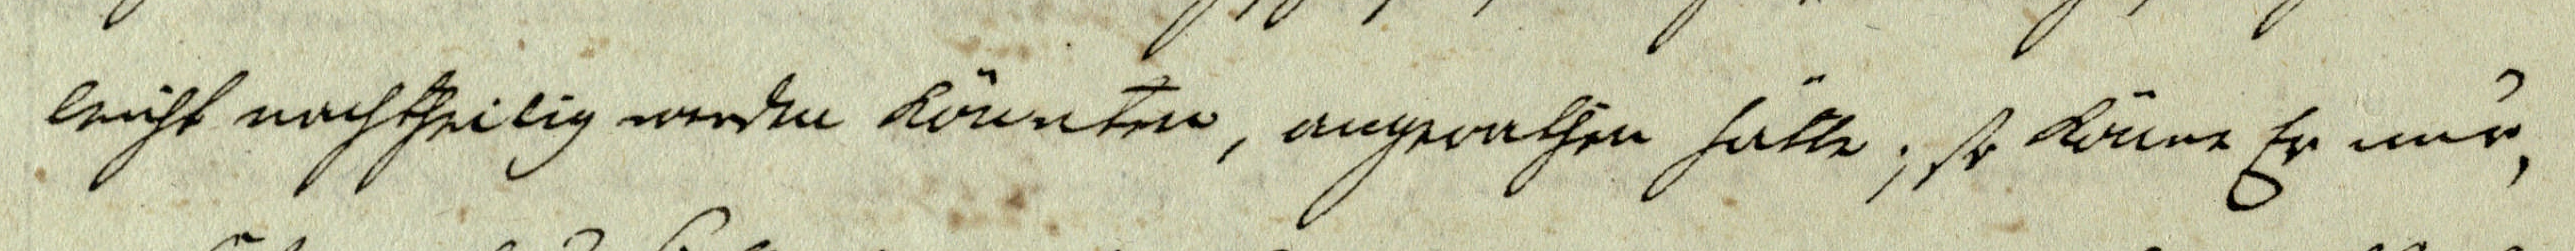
leicht nachtheilig werden könnten, angerathen hätte, so könne Er nur,
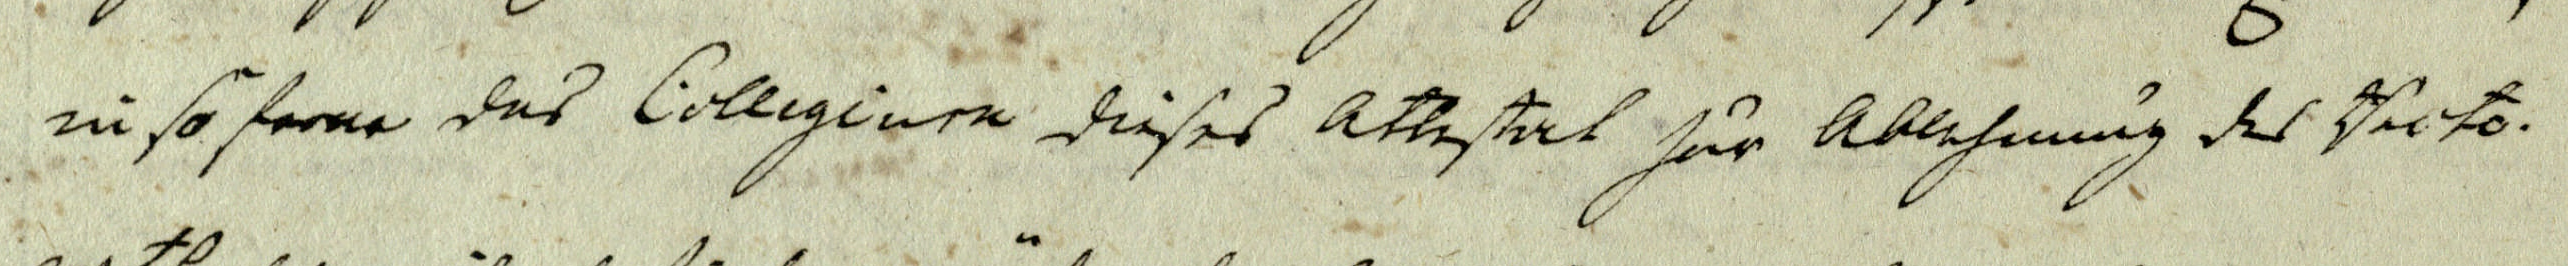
in so ferne des Collegium dieses Attestat zur Ablehnung des Recto¬
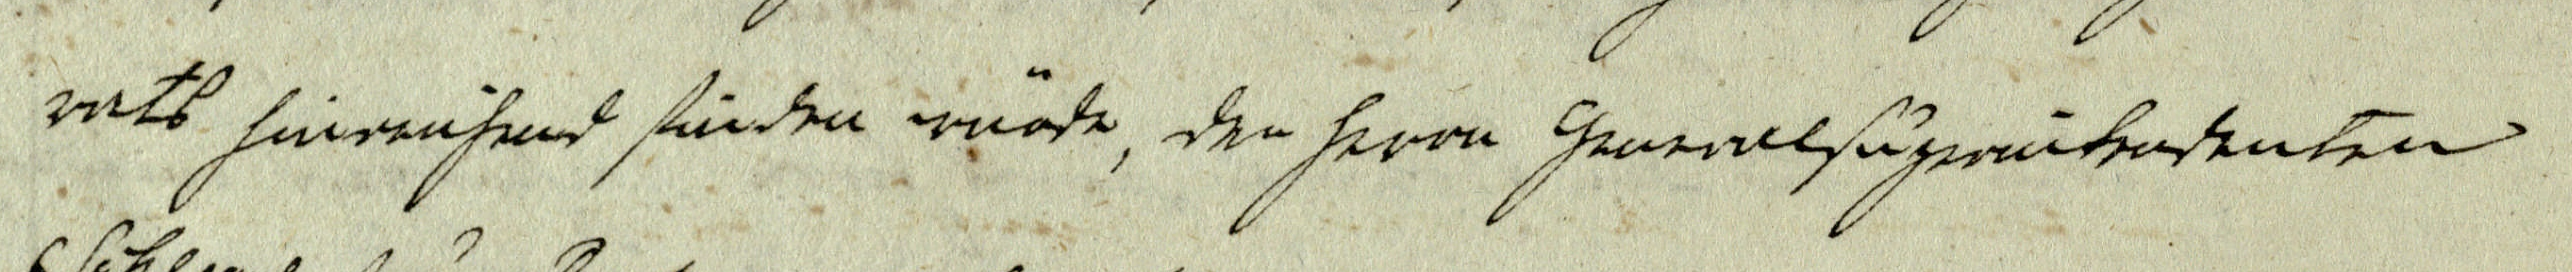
raths hinreichend finden würde, den Herrn Generalsuperintendenten
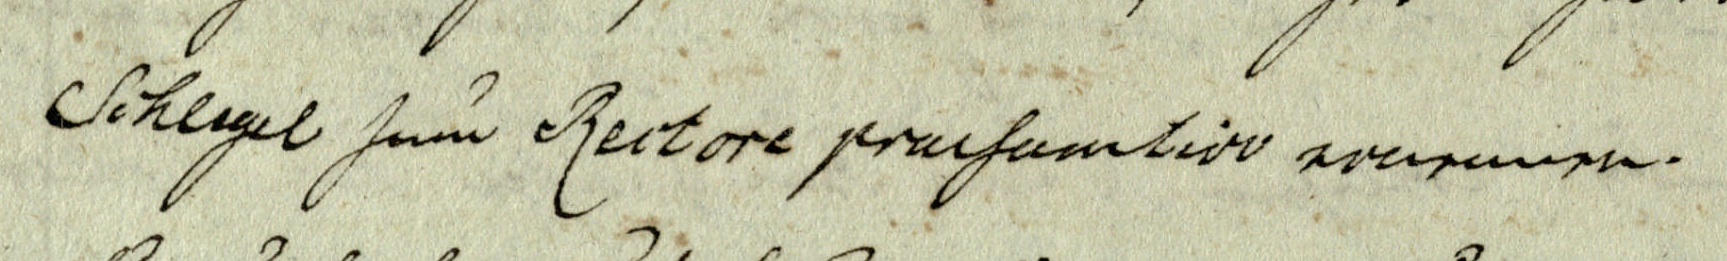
Schlegel zum Rectore praesumtivo ernennen.
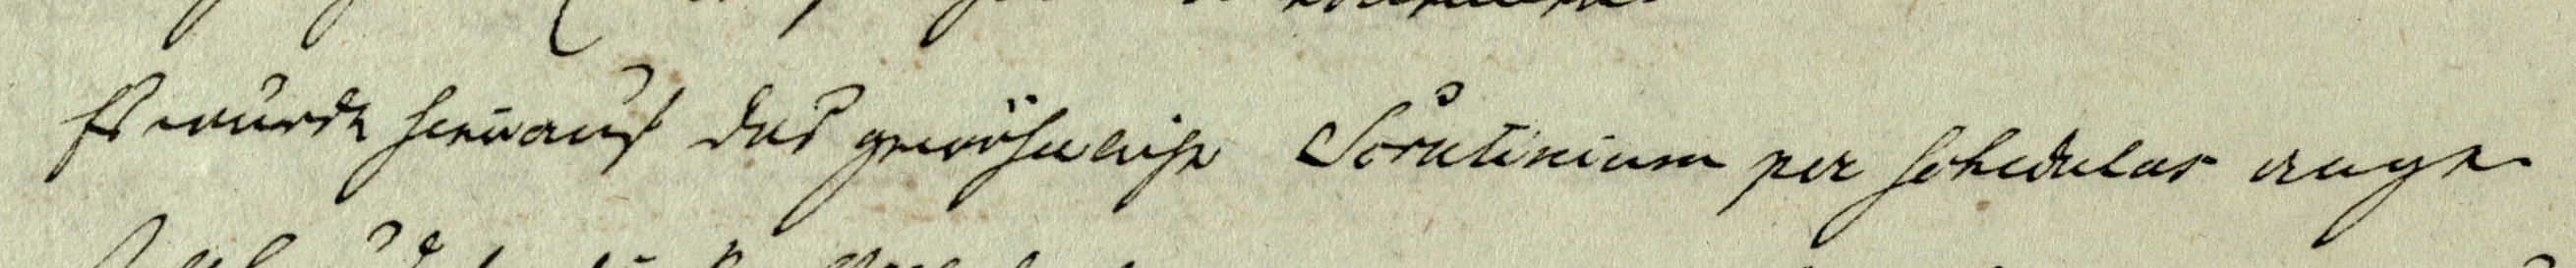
Es wurde hierauf das gewöhnliche Scrutinium per schedulus ange¬
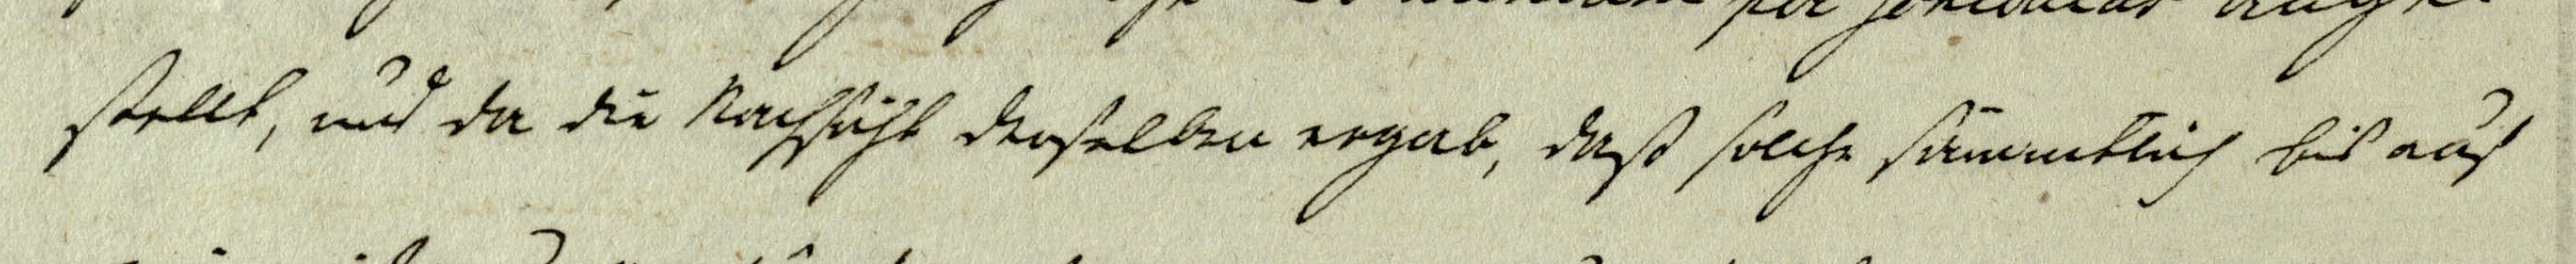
stellt, und da die Nachsicht derselben ergab, daß solche sämmtlich bis auf
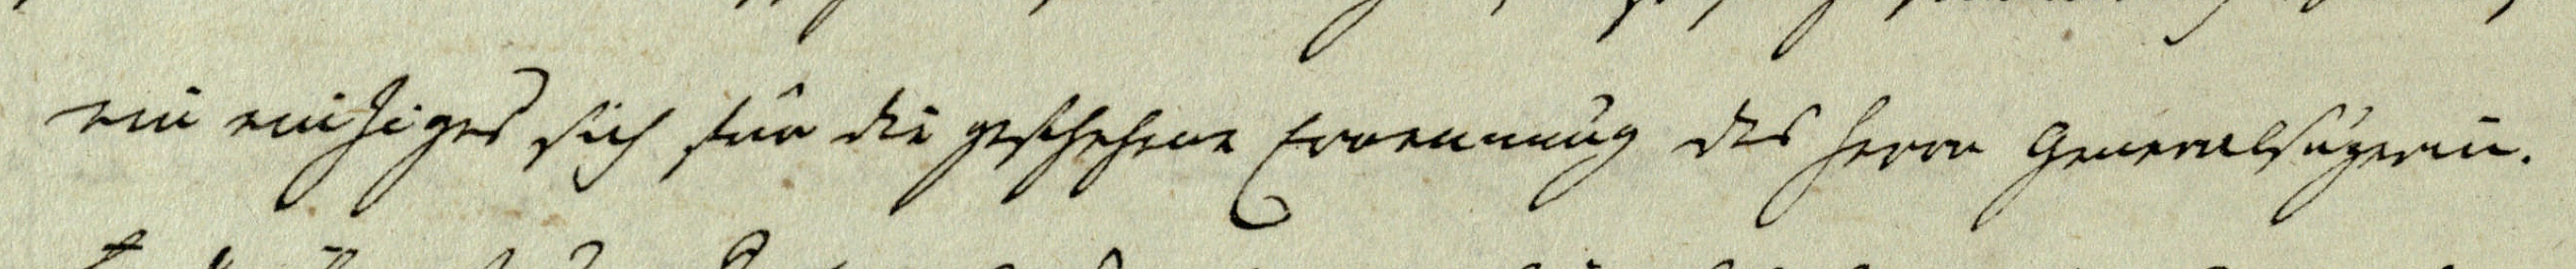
ein einziges sich für die geschehene Ernennung des Herrn Generalsuperin¬
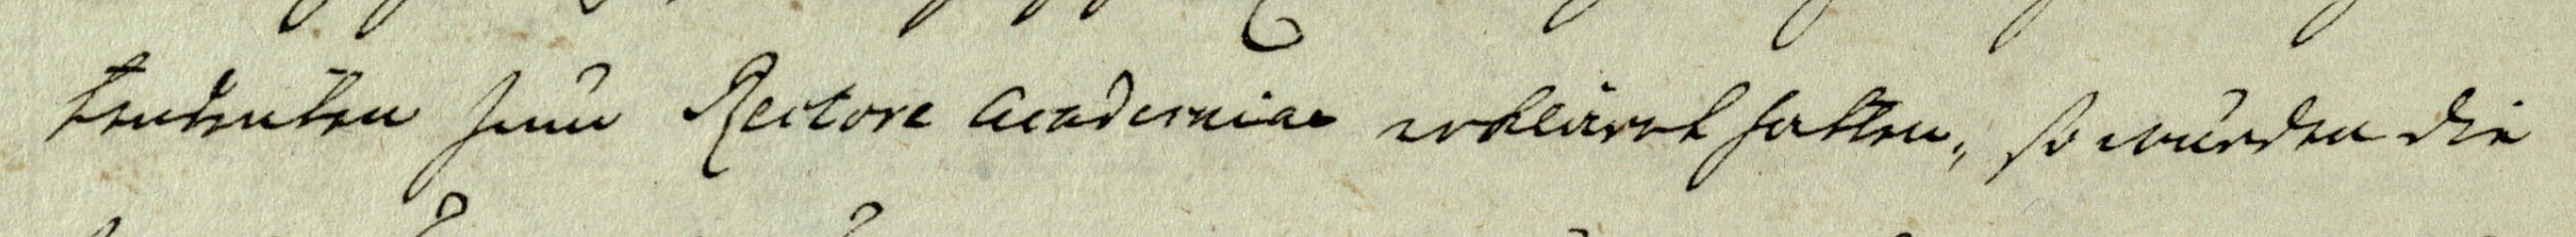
tendenten zum Rectore Academiae erkläret hatten, so wurden die
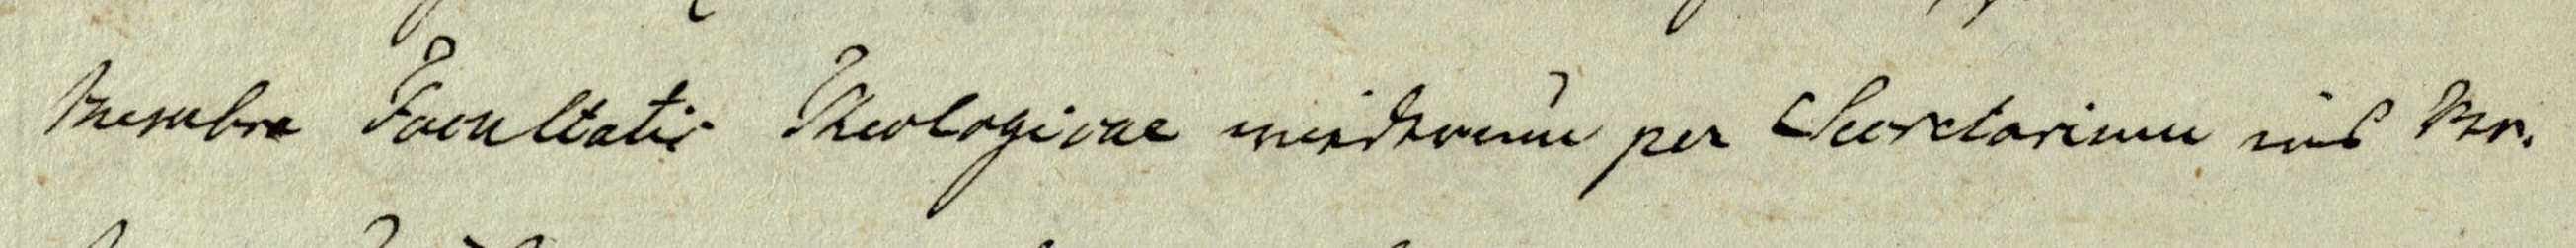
Membra Facultatis Theologicae wiederum per Secretarium ins Ver¬
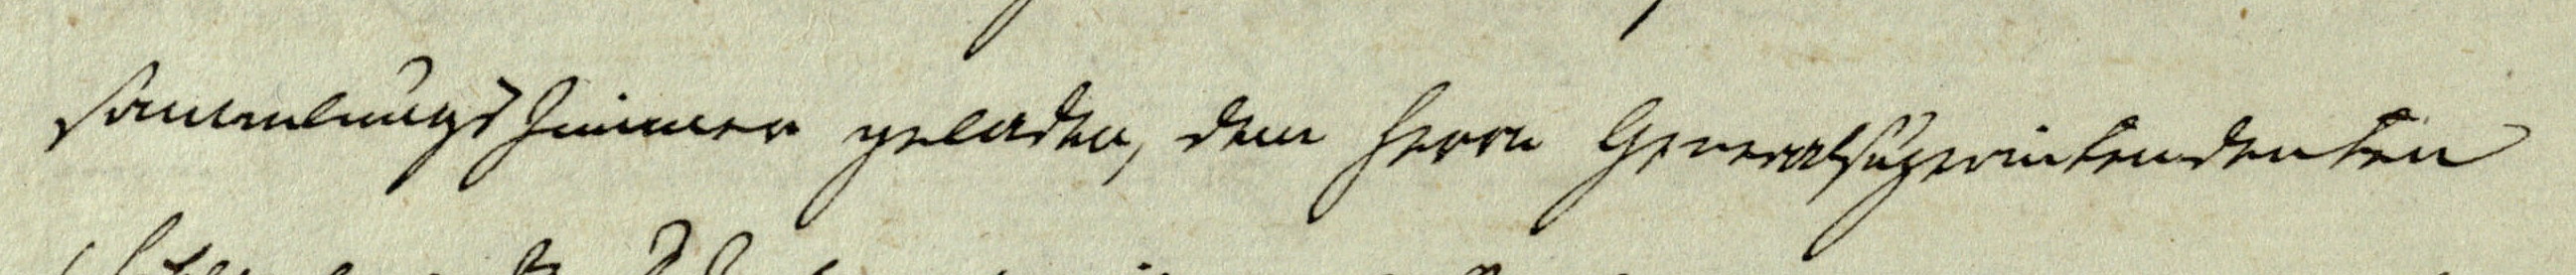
sammlungsZimmer geladen, dem Herrn Generalsuperintendenten
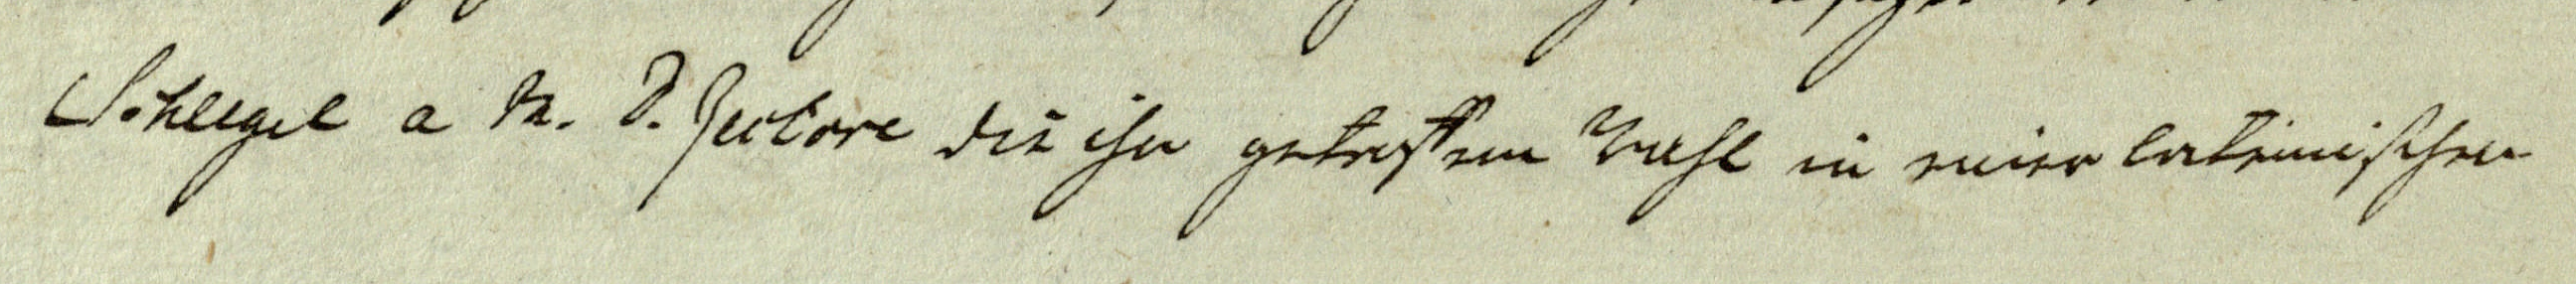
Schlegel a M. D. Rectore die ihn getroffene Wahl in einer lateinischen
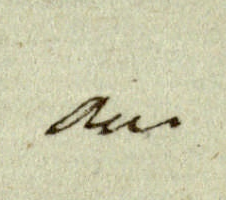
An
